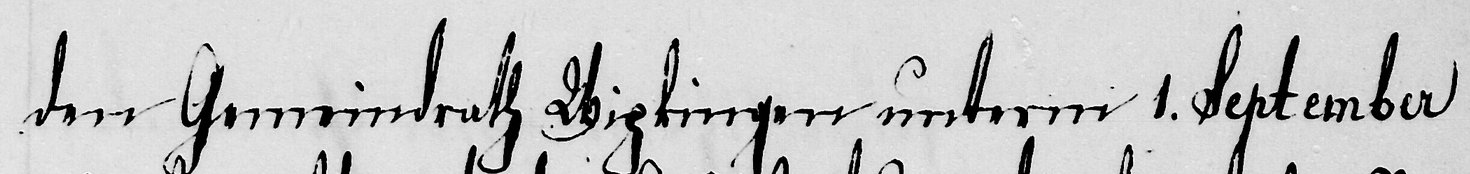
den Gemeinderath Wipkingen unterm 1. September
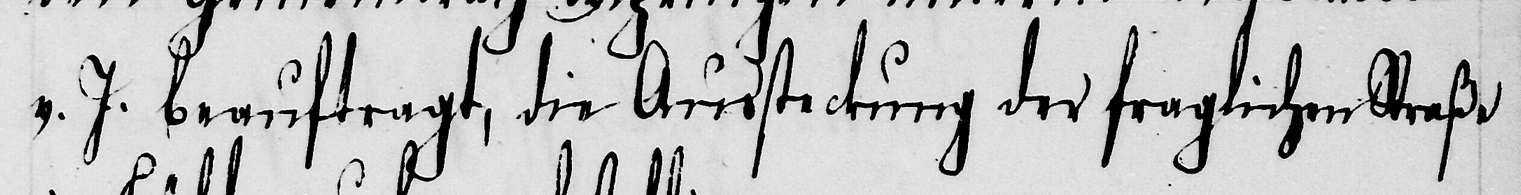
v. J. beauftragt, die Aussteckung der fraglichen Straße
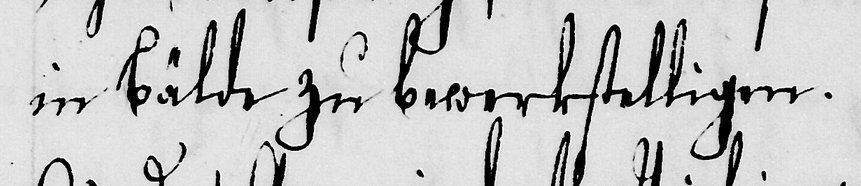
in Bälde zu bewerkstelligen.
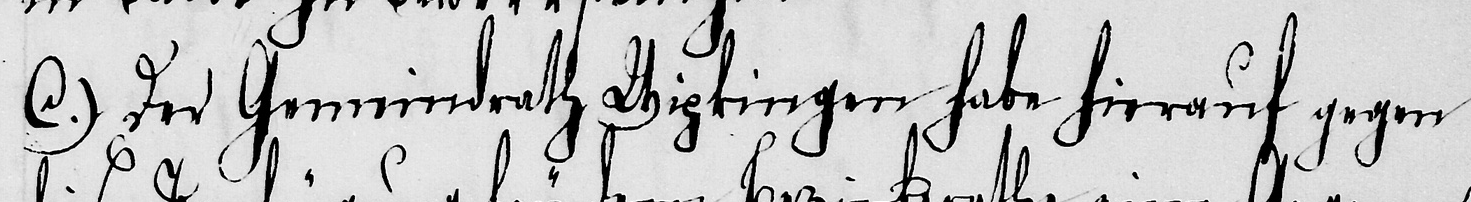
C.) Der Gemeindrath Wipkingen habe hierauf gegen
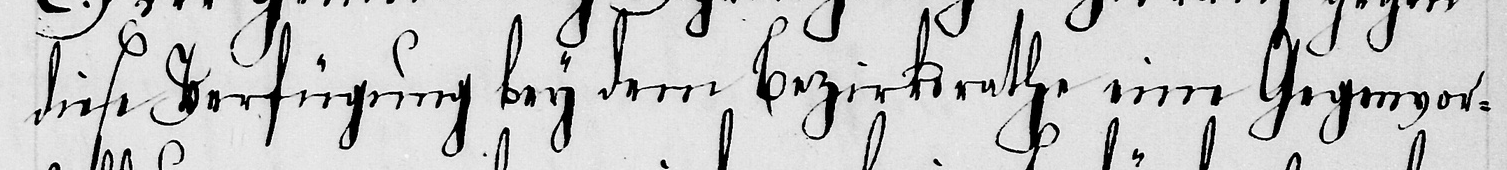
diese Verfügung bey dem Bezirksrathe eine Gegenvors¬
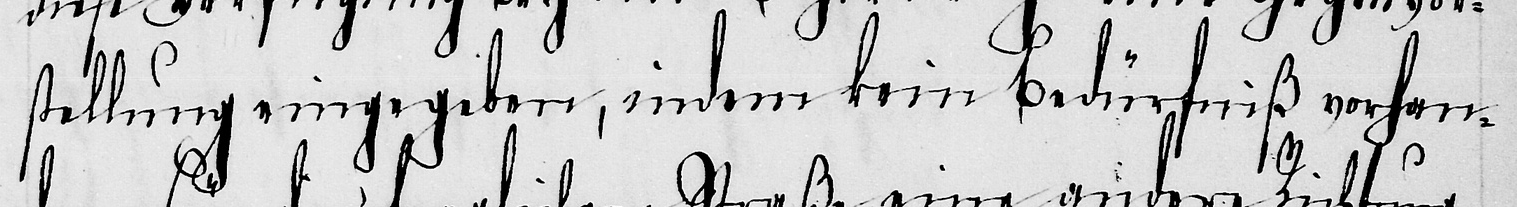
tellung eingegeben, indem kein Bedürfniß vorhan¬
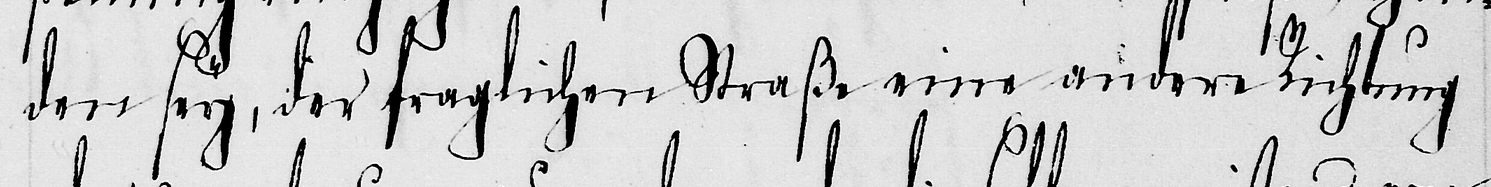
den sey, der fraglichen Straße eine andere Richtung
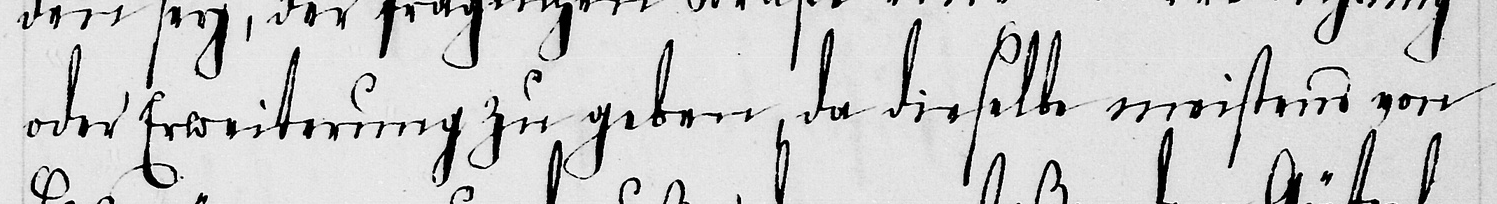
oder Erweiterung zu geben, da dieselbe meistens von
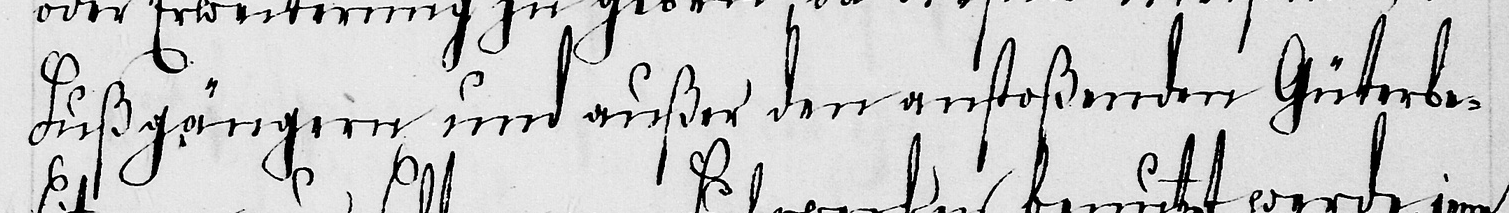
Fußgängern und außer den anstoßenden Güterbe¬
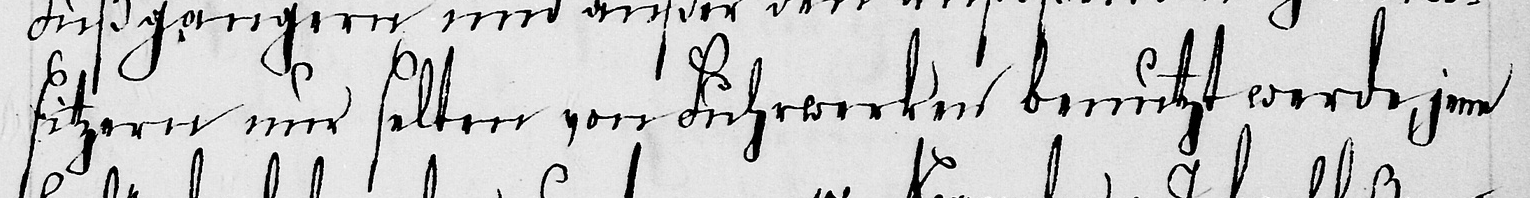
sitzern nur selten von Fuhrwerken benutzt werde, jene
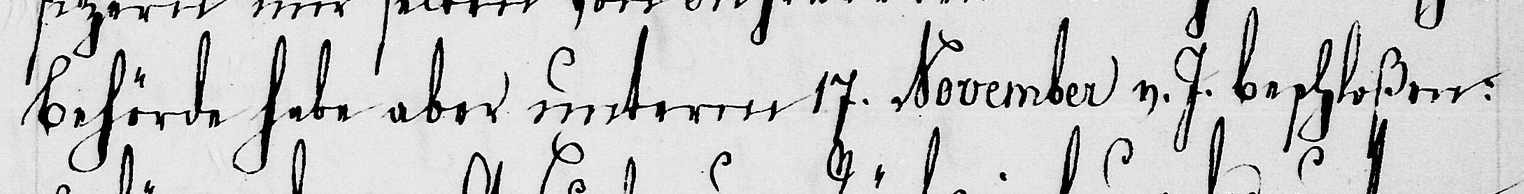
Behörde habe aber unterm 17. November v. J. beschloßen:
